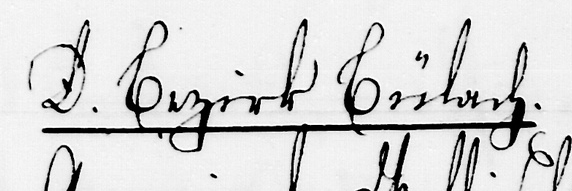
D. Bezirk Bülach.
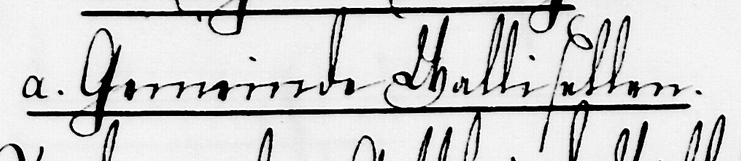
a. Gemeinde Wallisellen.
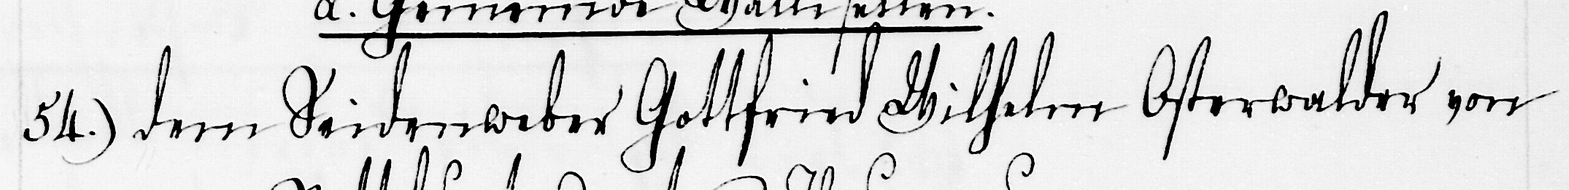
54.) dem Seidenweber Gottfried Wilhelm Osterwalder von
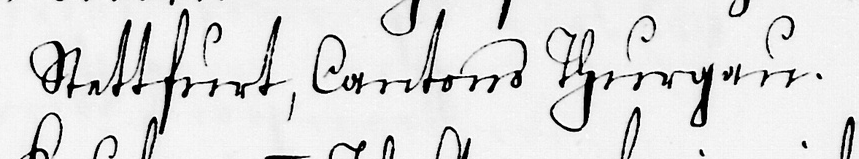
Stettfurt, Cantons Thurgau.
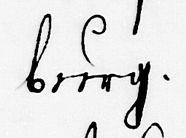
burg.
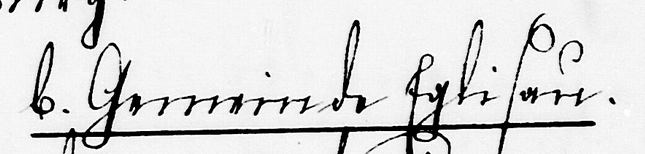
b. Gemeinde Eglisau.
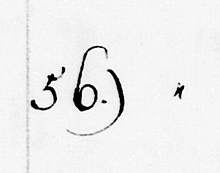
56.)
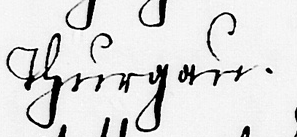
Thurgau.
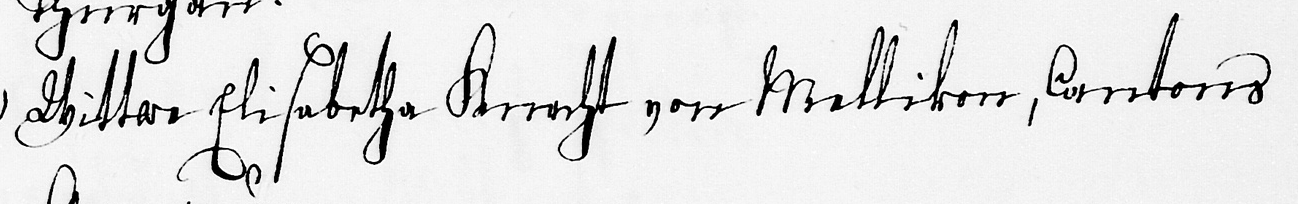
ittwe Elisabetha Knecht von Mellikon, Cantons
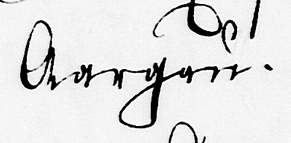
Aargau.
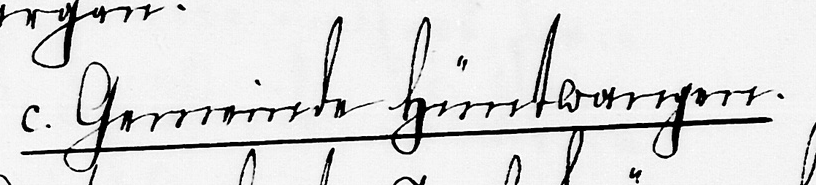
c. Gemeinde Hüntwangen.
